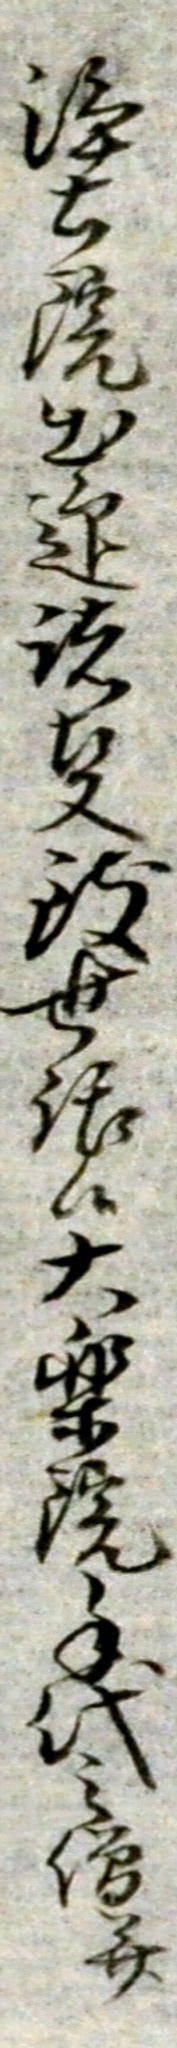浄土院出迎諸事致世話候大楽院手代之僧幷
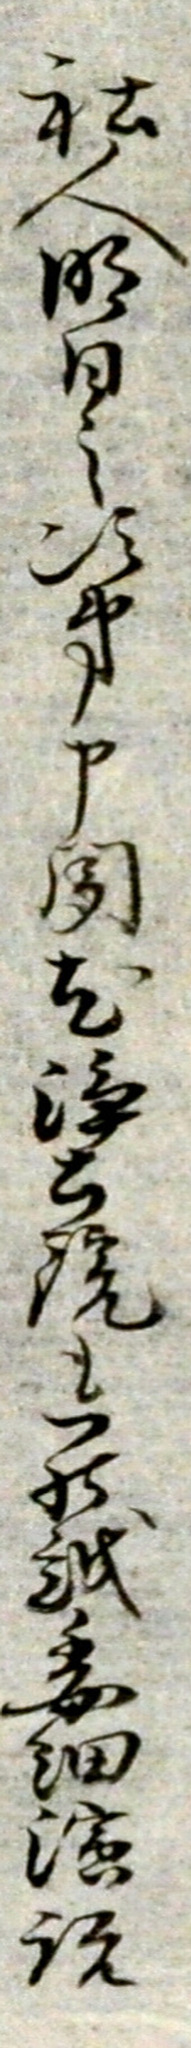社人明日之次第申聞尤浄土院も罷越委細演説
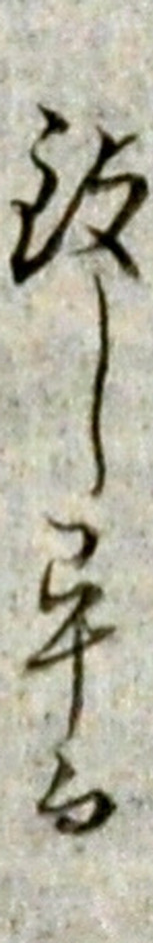致し畢而
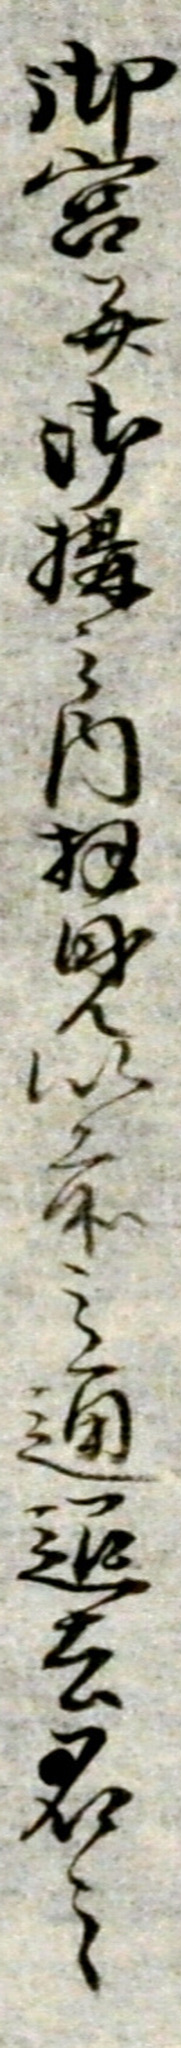御宮幷御構之内拝見以前之通退去名之
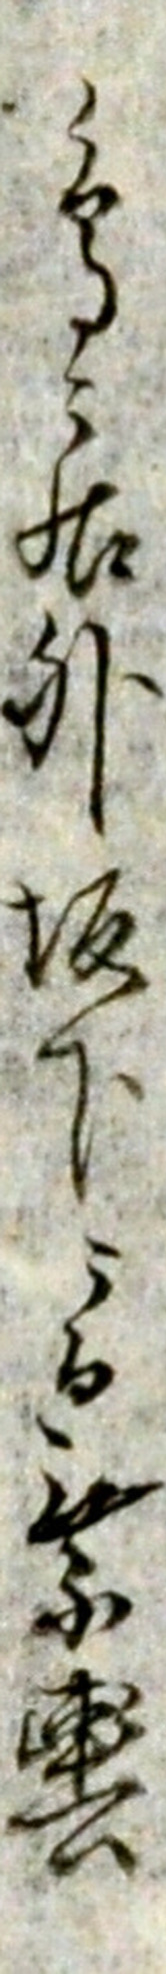鳥居外坂下ニ而乗輿
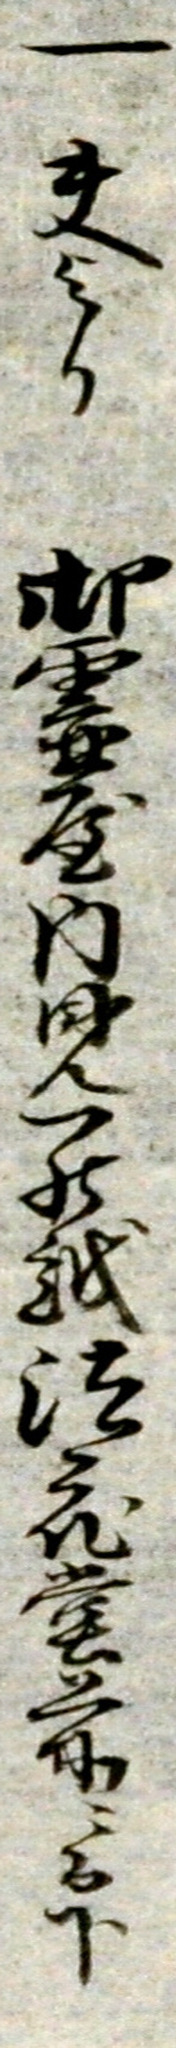一夫より御霊屋内見罷越法花堂前ニ而下
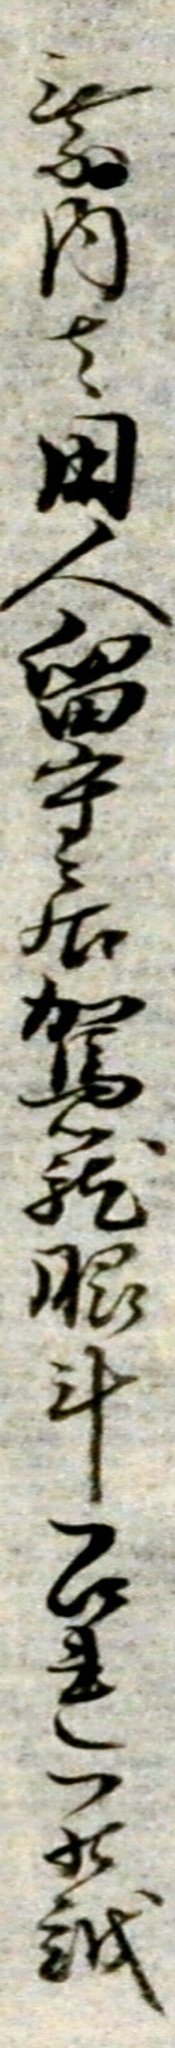乗内者用人留守居駕籠脇斗召連罷越
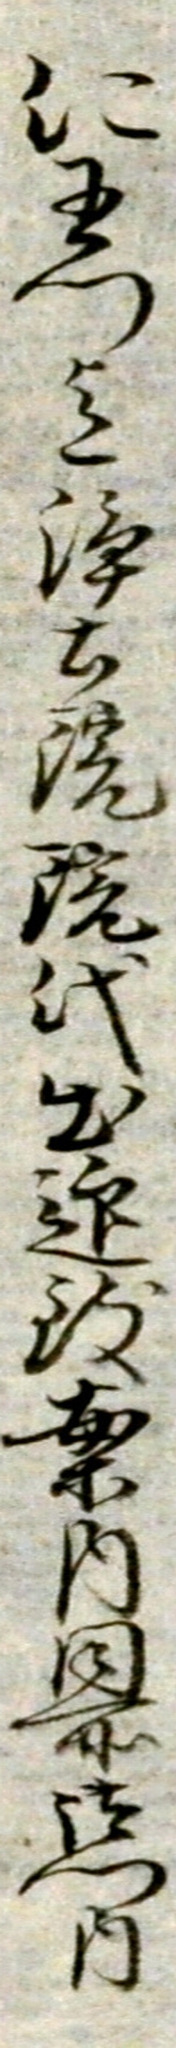仁王門迄浄土院代出迎致案内同所御門内
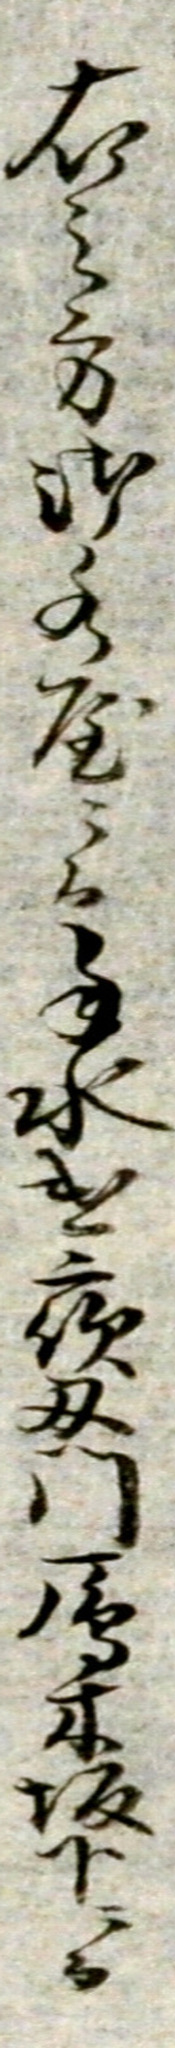右之方御水屋ニ而手水遣夜刃門雁木坂下ニ而
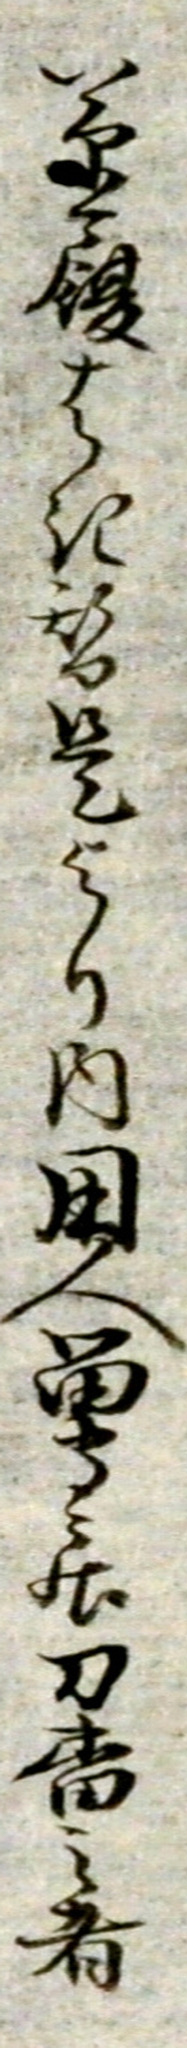草履はき替是より内用人留守居刀番之者
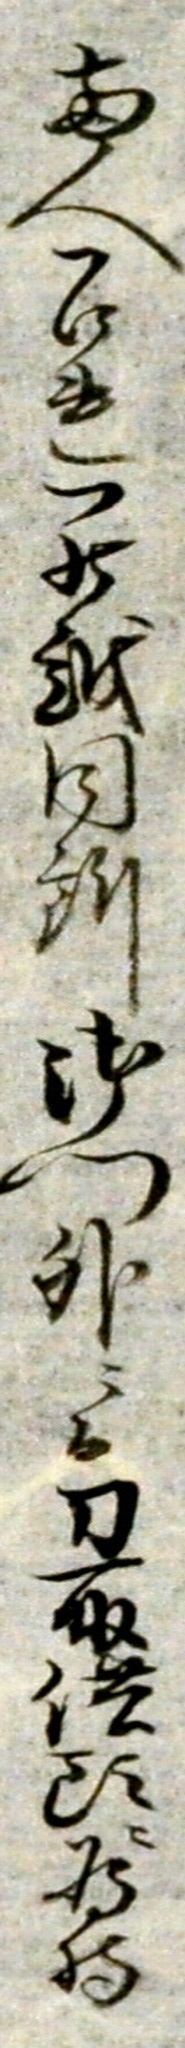両人召連罷越同所御門外ニ而刀取供頭ニ為持
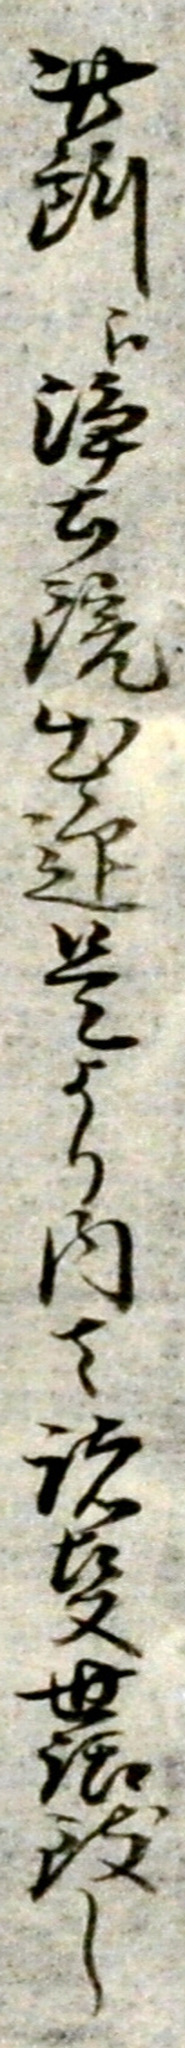此所江浄土院出迎是より内者諸事貰致し
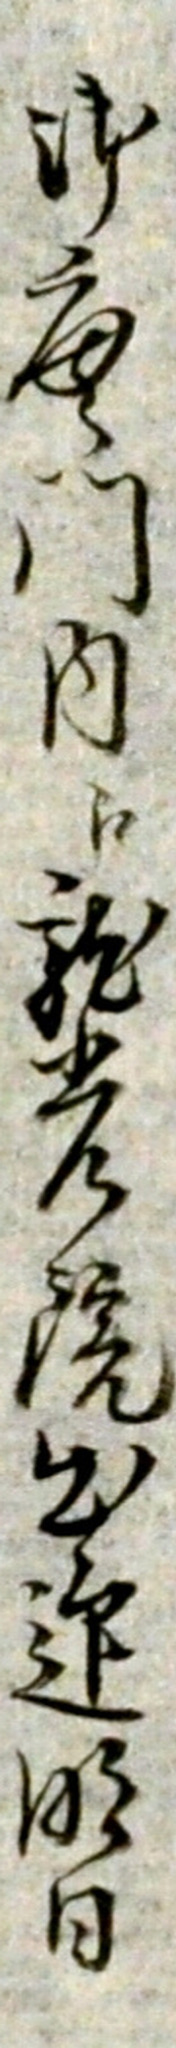御唐門内江龍光院出迎明日
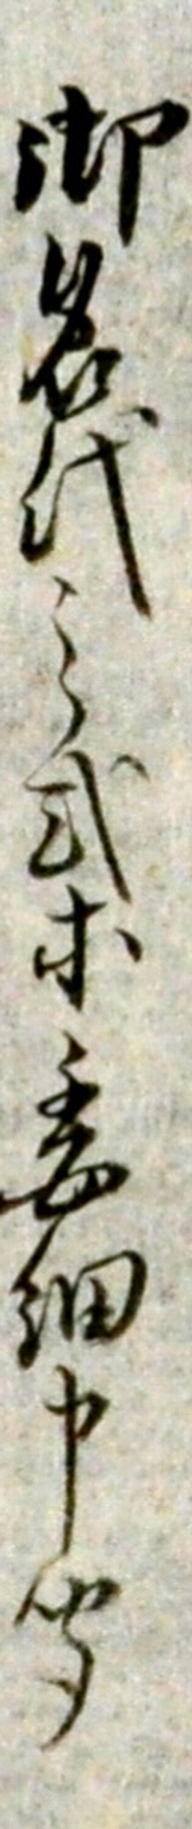御名代之式等委細申聞
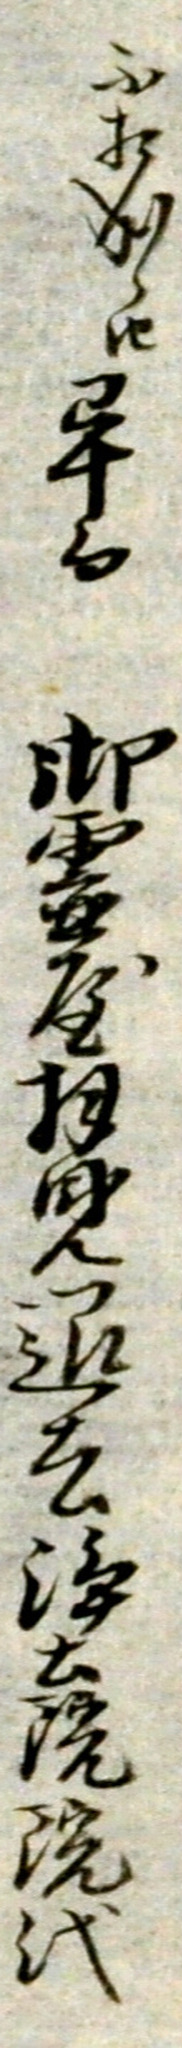不相成候由畢而御霊屋拝覧退去浄土院院代
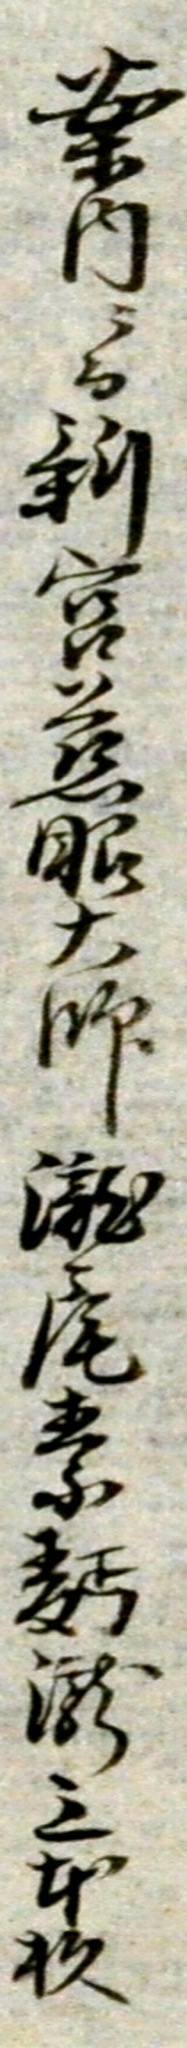案内ニ而新宮慈眼大師瀧尾素麺瀧三本杉
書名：日光御名代相勤候節ノ留
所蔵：伊那市立高遠町図書館・合同会社AMANE
